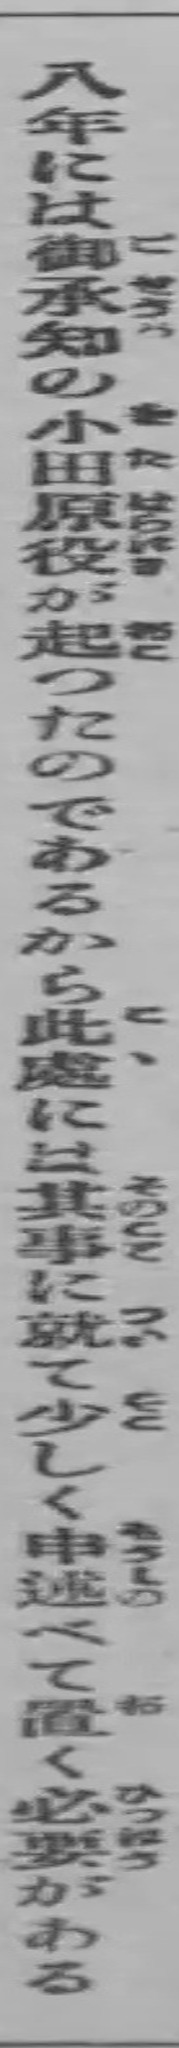八年には御承知の小田原役が起つたのであるから此処には其事に就て少しく申述べて置く必要がある
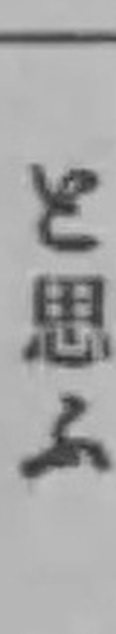と思ふ
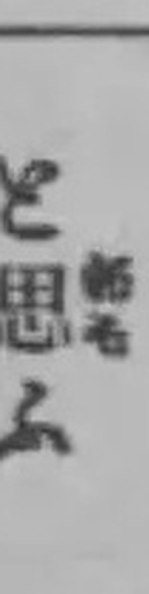と思ふ

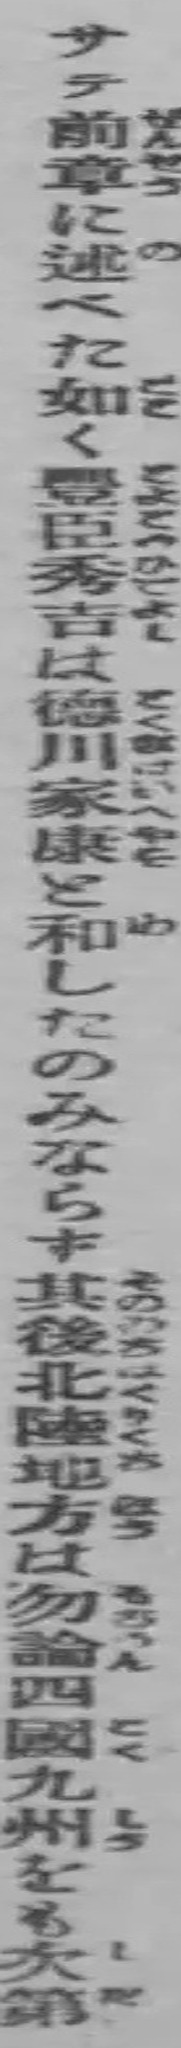サテ前章に述べた如く豊臣秀吉は徳川家康と和したのみならず其後北陸地方は勿論四国九州をも次第
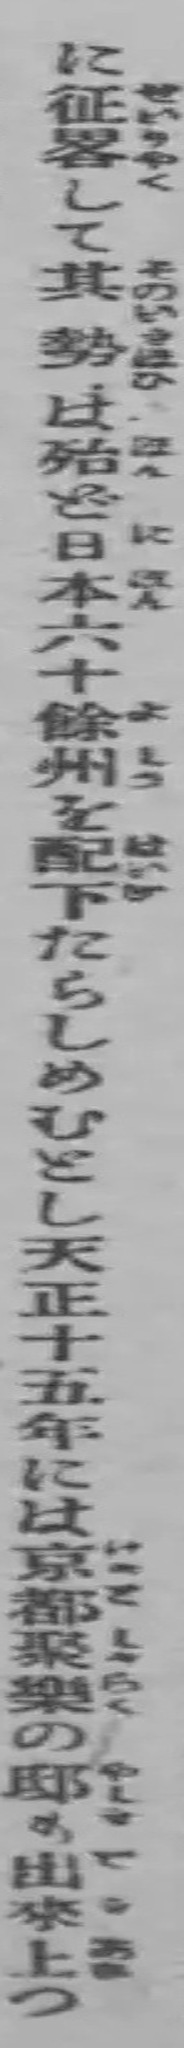に征略して其勢は殆ど日本六十余州を配下たらしめむとし天正十五年には京都聚楽の邸も出来上つ
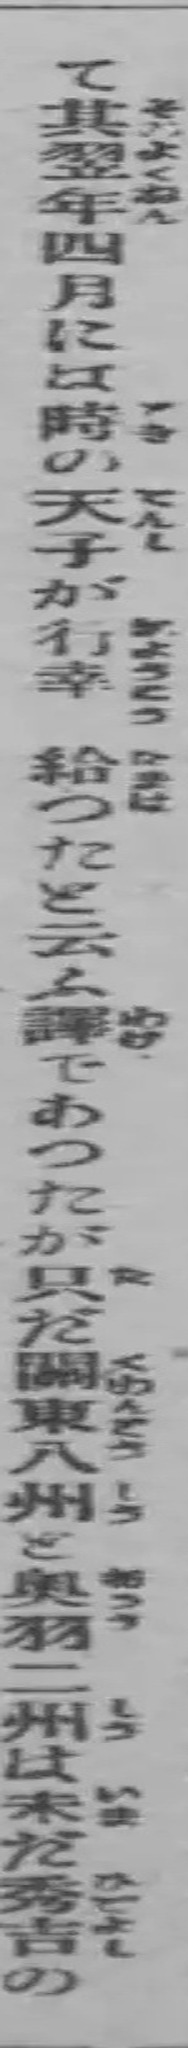て其翌年四月には時の天子が行幸給つたと云ふ訳であつたが只だ関東八州と奥羽二州は未だ秀吉の
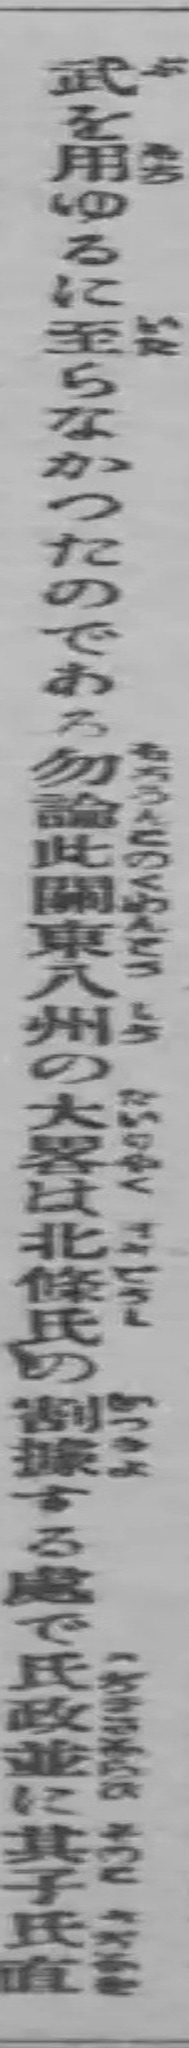武を用ゆるに至らなかつたのである勿論此関東八州の大略は北條氏の割拠する処で氏政並に其子氏直
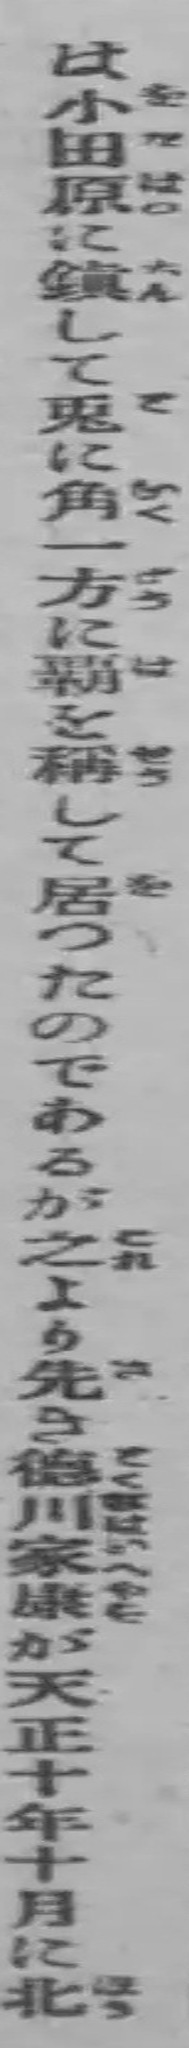は小田原に鎮して兎に角一方に覇を称して居つたのであるが之より先き徳川家康が天正十年十月に北
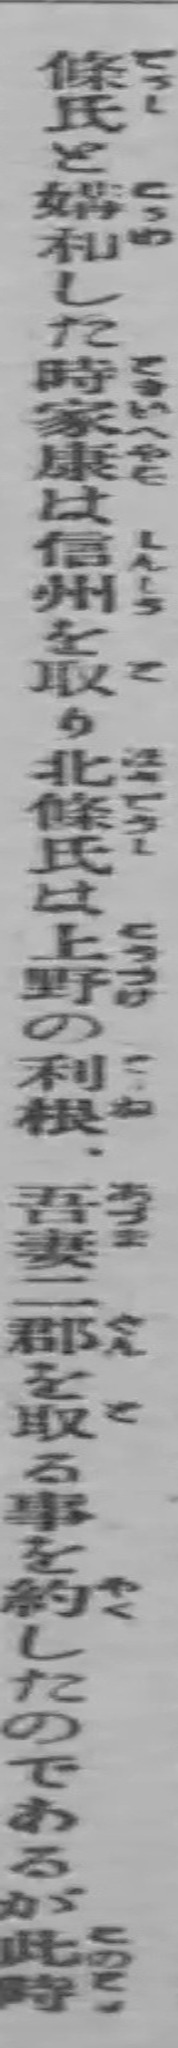真田昌幸條氏と媾和した時家康は信州を取り北條氏は上野の利根、吾妻二郡を取る事を約したのであるが此時
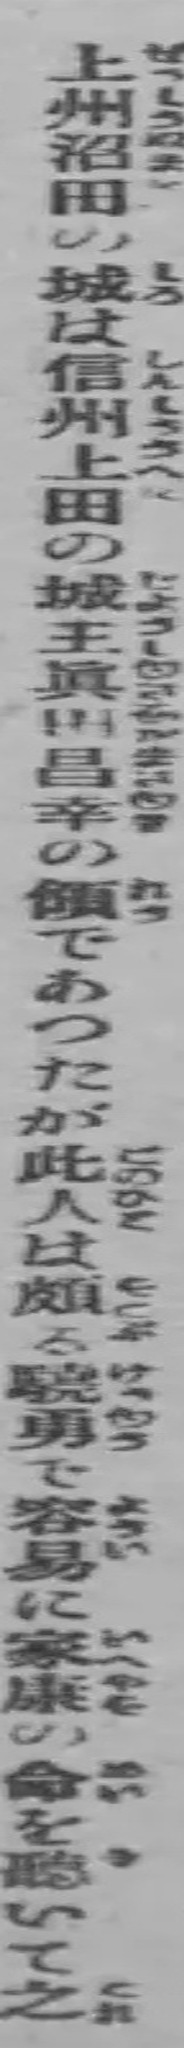上州沼田の城は信州上田の城主真田昌幸の領であつたが此人は頗る驍勇で容易に家康の命を聴いて之
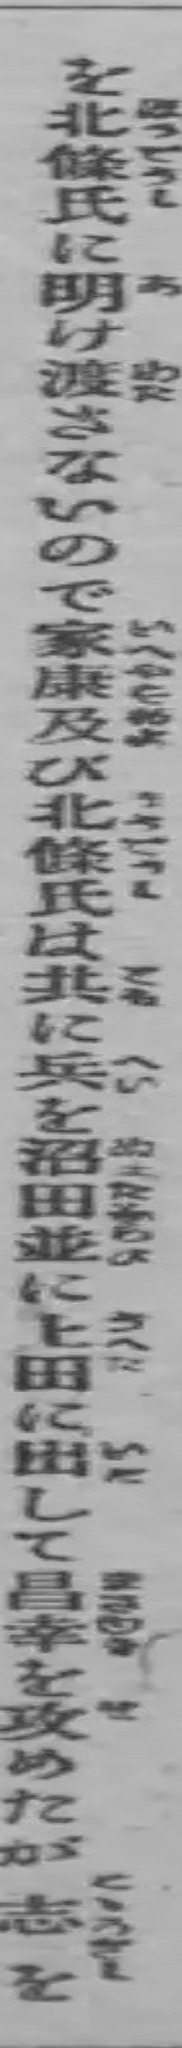を北條氏に明け渡さないので家康及び北條氏は共に兵を沼田並に上田に出して昌幸を攻めたが志を
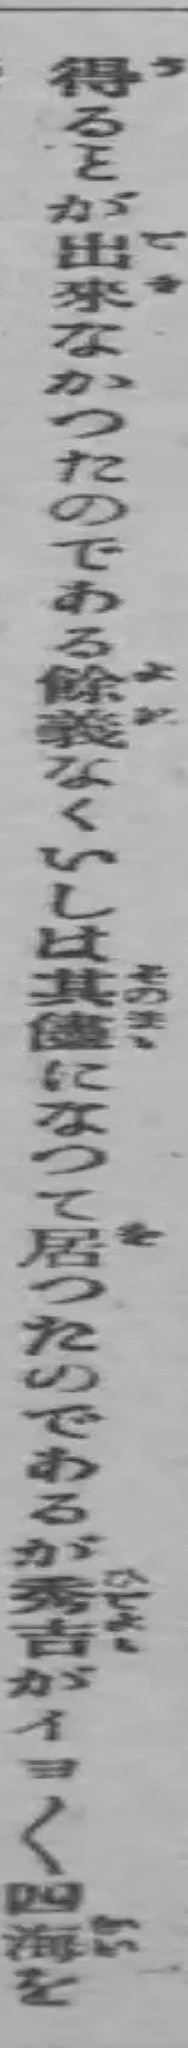得ることが出来なかつたのである余義なくいしは其侭になつて居つたのであるが秀吉がイヨ〳〵四海を
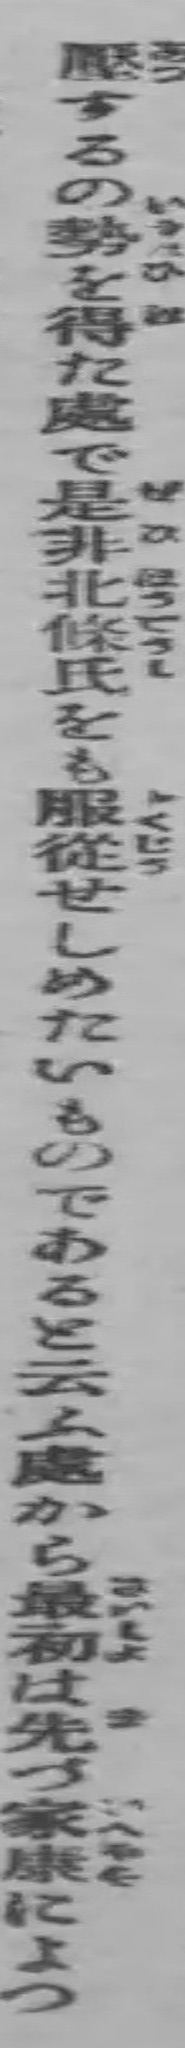圧するの勢を得た処で是非北條氏をも服従せしめたいものであると云ふ処から最初は先づ家康によつ
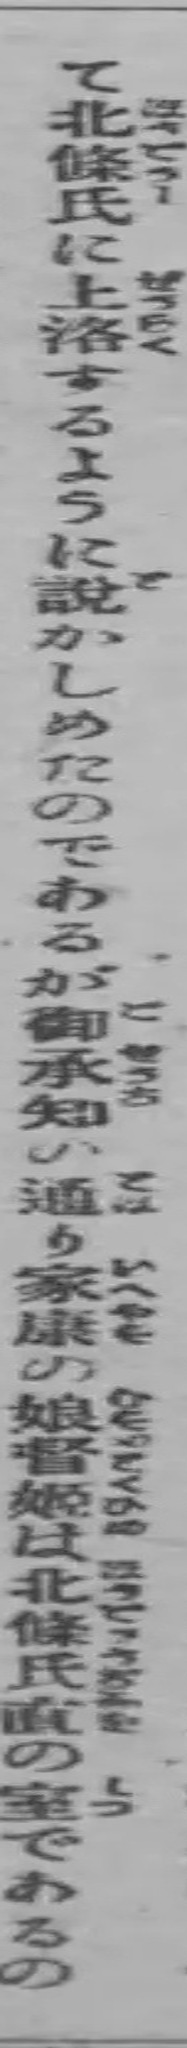て北條氏に上洛するように説かしめたのであるが御承知の通り家康の娘督姫は北條氏直の室であるの
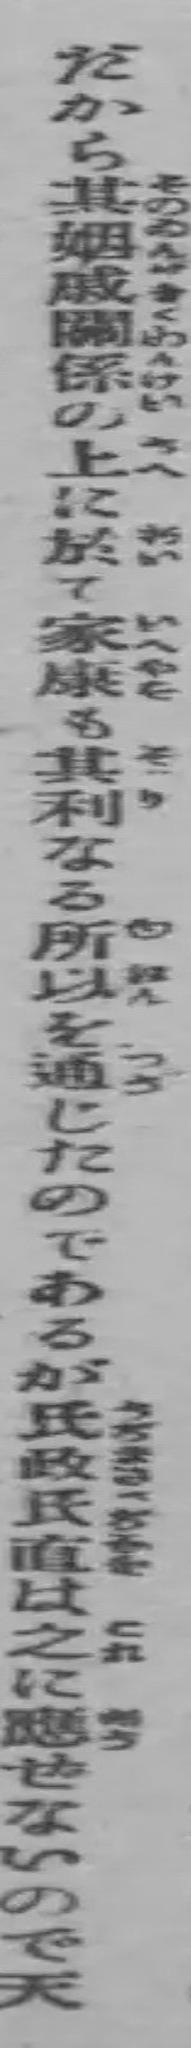だから其姻戚関係の上に於て家康も其利なる所以を通じたのであるが氏政氏直は之に応ぜないので天
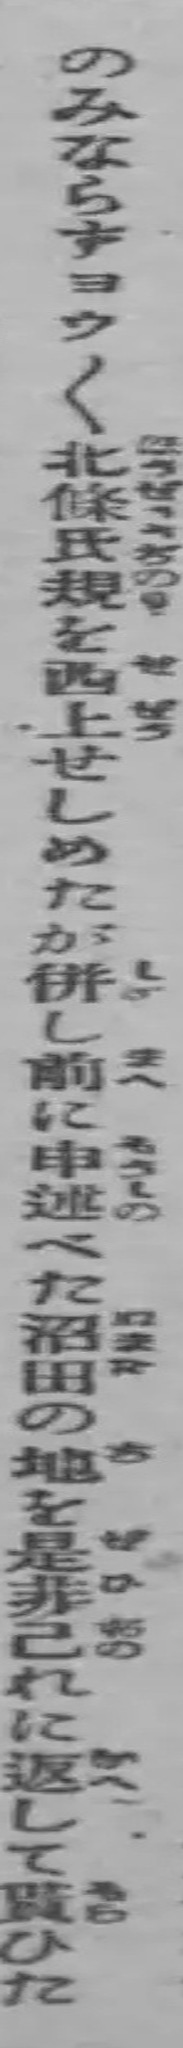のみならずヨウ〳〵北條氏規を西上せしめたが併し前に申述べた沼田の地を是非己れに返して貰ひた
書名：豊橋市史談
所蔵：国立国会図書館 National Diet Library, JAPAN
